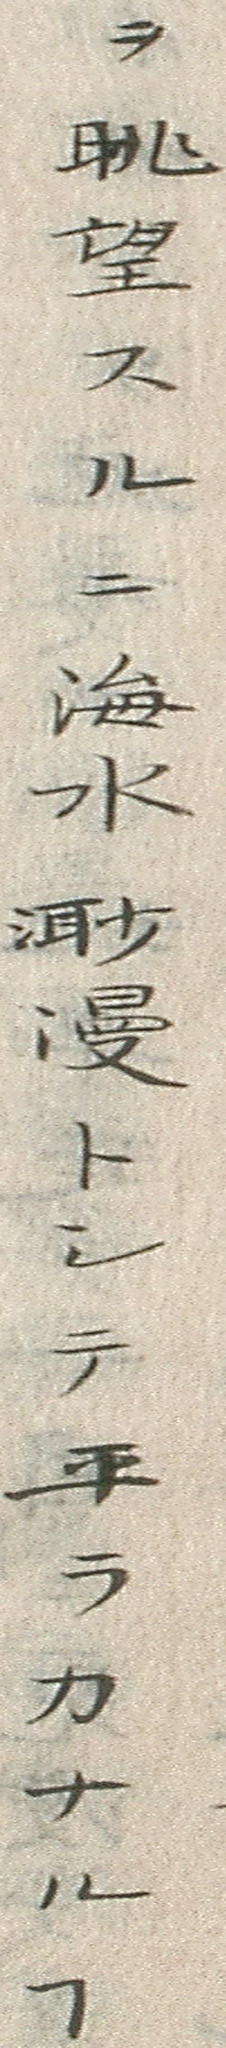ヲ眺望スルニ海水渺漫トシテ平ラカナルコト
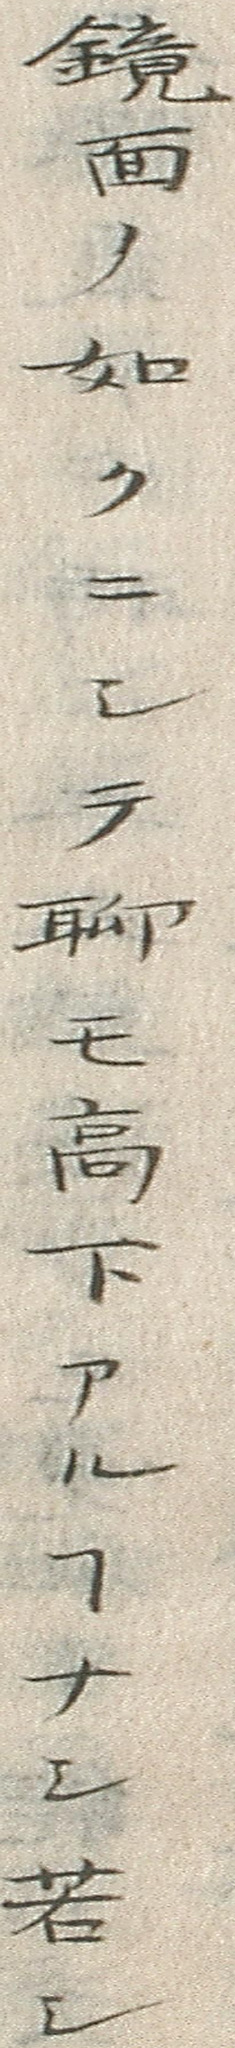鏡面ノ如クニシテ聊モ高下アルコトナシ若シ
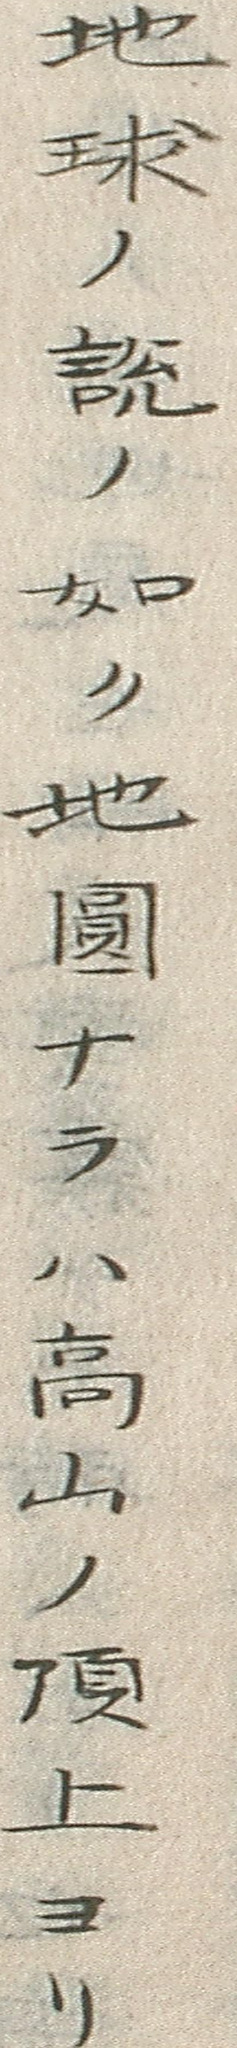地球ノ説ノ如ク地円ナラハ高下ノ頂上ヨリ
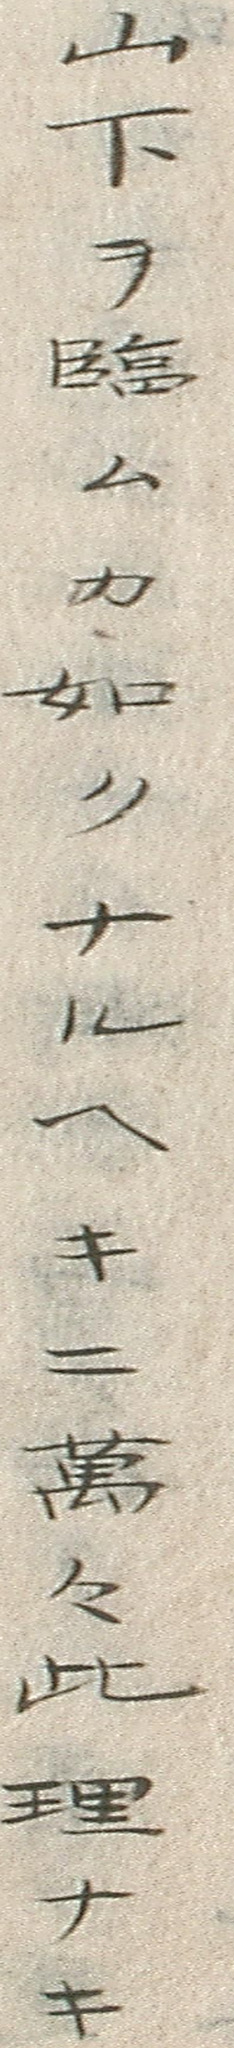山下ヲ臨ムカ如クナルヘキニ万々此理ナキ
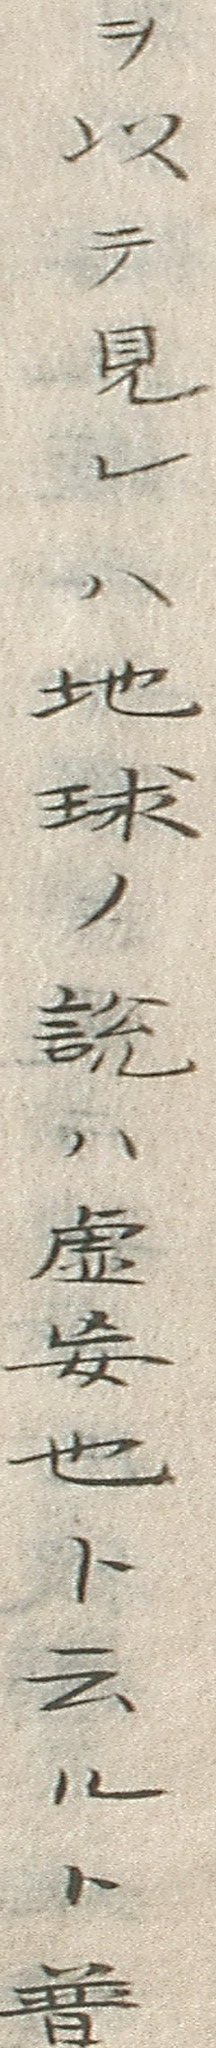ヲ以テ見レハ地球ノ説ハ虚妄也ト云ルト普
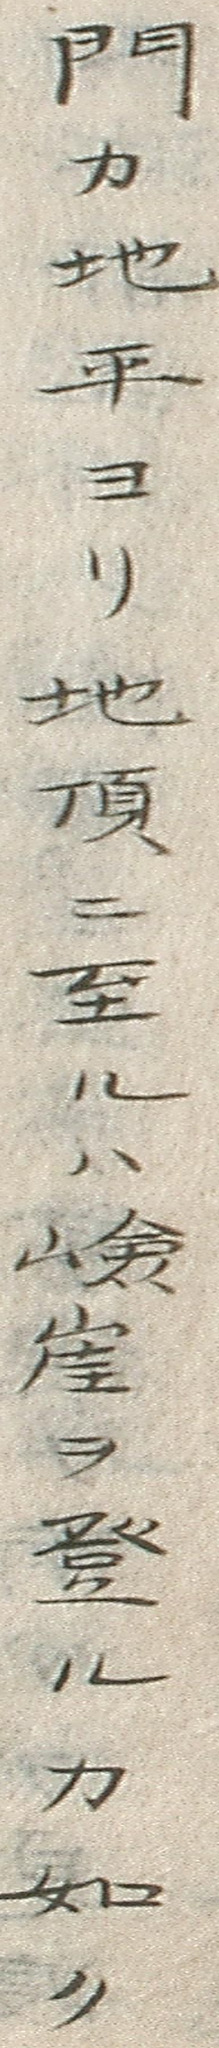門カ地平ヨリ地頂ニ至ルハ嶮崖ヲ登ルカ如ク
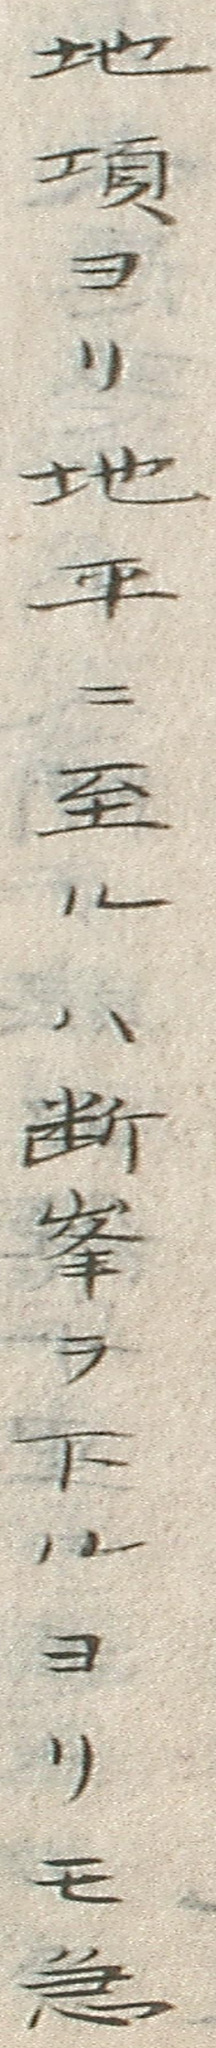地頂ヨリ地平ニ至ルハ断峯ヲ下ルヨリモ急
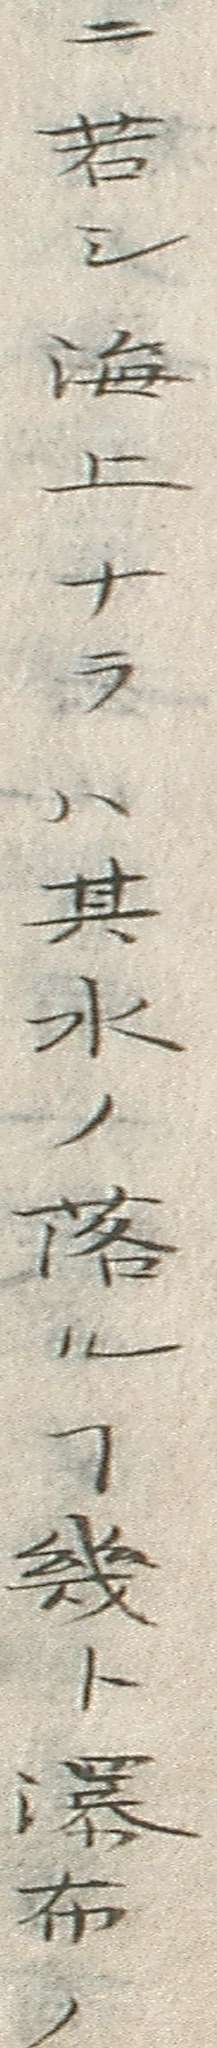ニ若シ海上ナラハ其水ノ落ルコト幾ト瀑布ノ
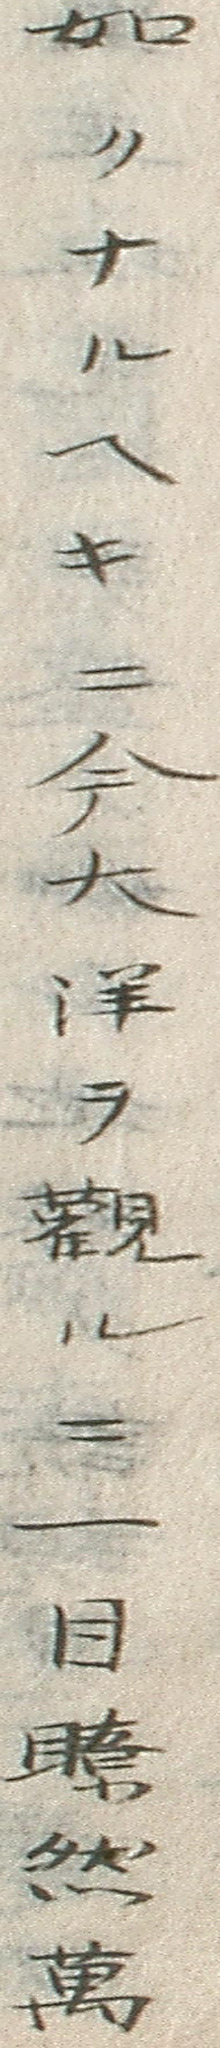如クナルヘキニ今大洋ヲ観ルニ一目瞭然万

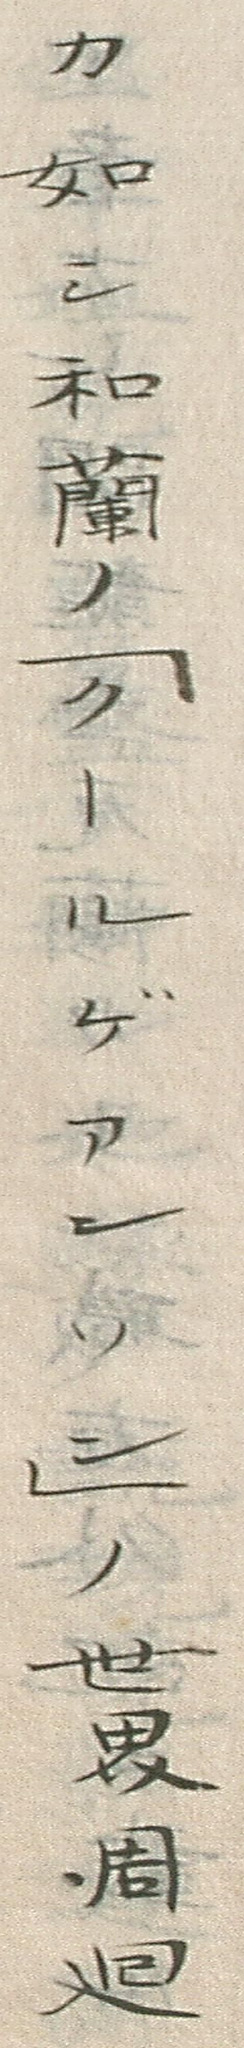カ如シ和蘭ノ「クールゲアンソン」ノ世界周廻
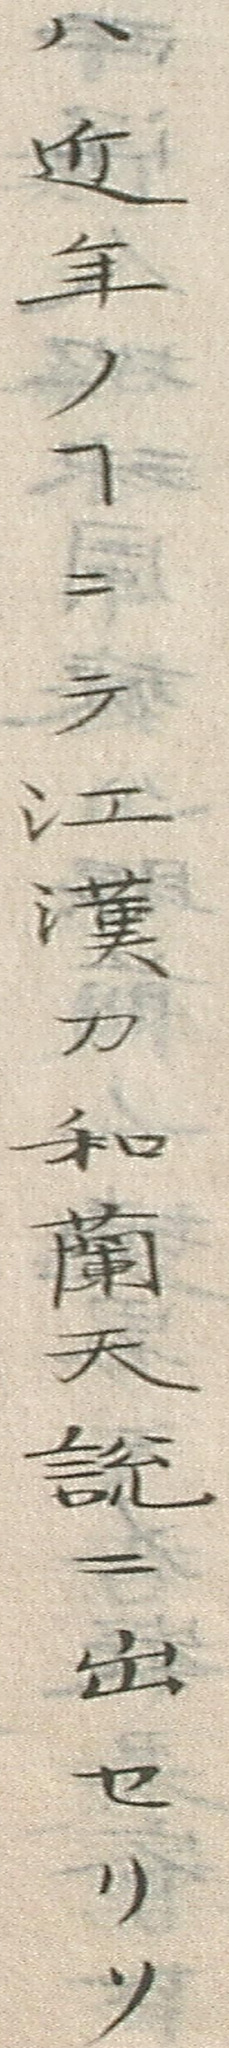ハ近年ノコトニテ江漢カ和蘭天説ニ出セリソ
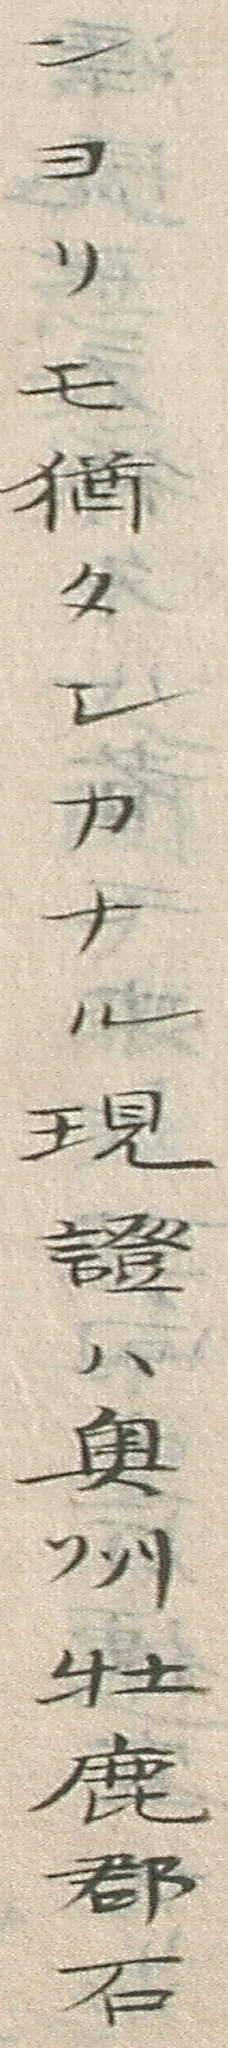ンヨリモ猶タシカナル現証ハ奥州牡鹿郡石
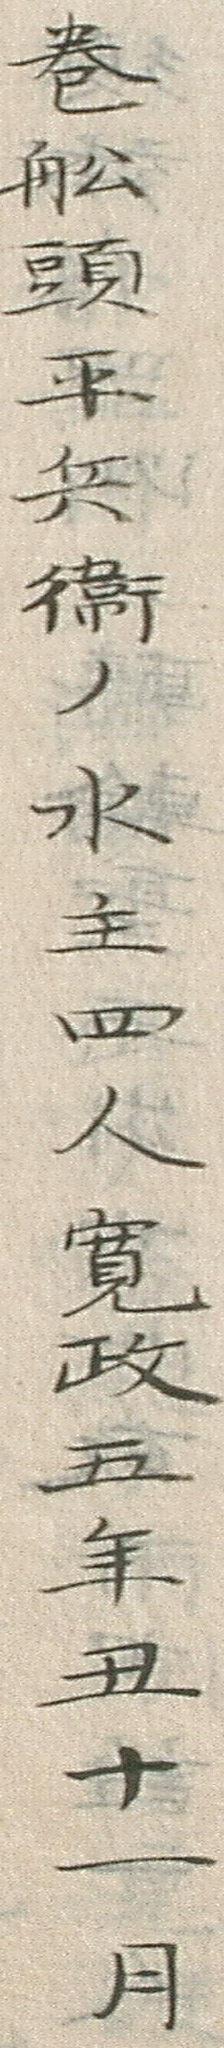巻舩頭平兵衛ノ水主四人寛政五年丑十一月
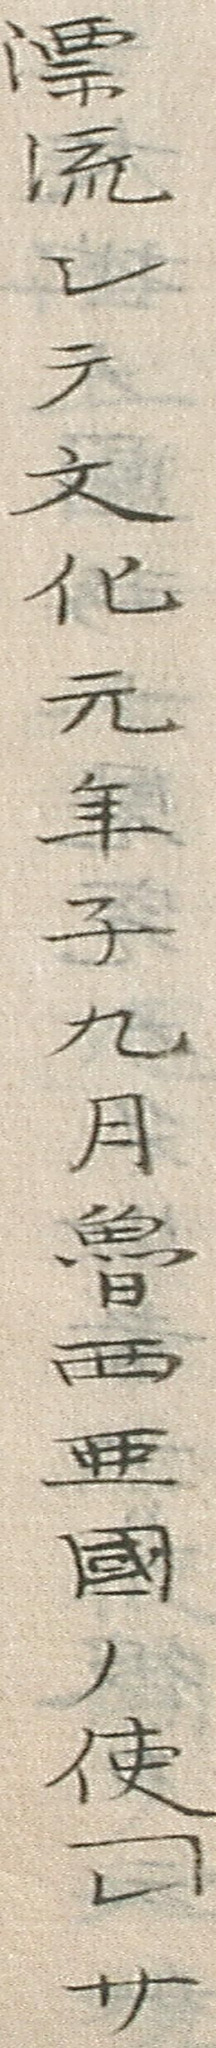漂流シテ文化元年子九月魯西亜国ノ使「レサ
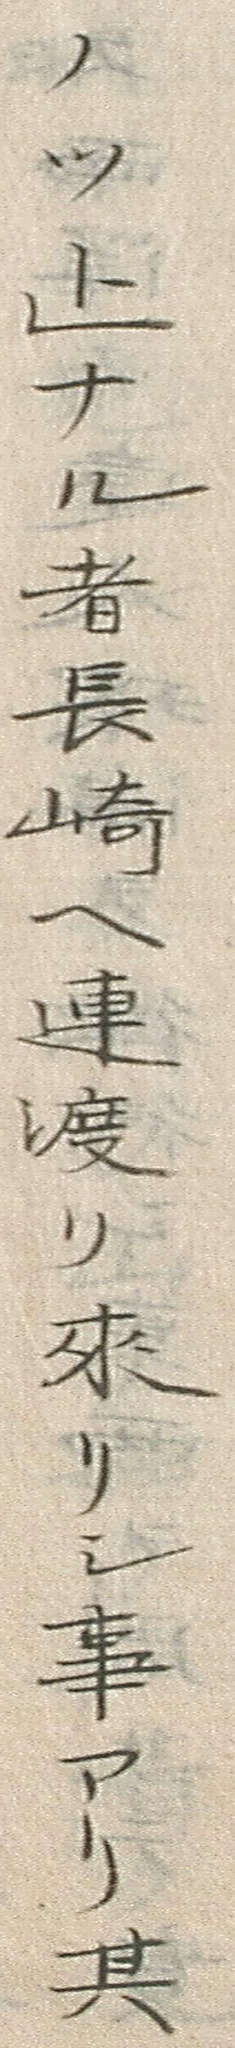ノツト」ナル者長崎ヘ連渡リ来リシ事アリ其
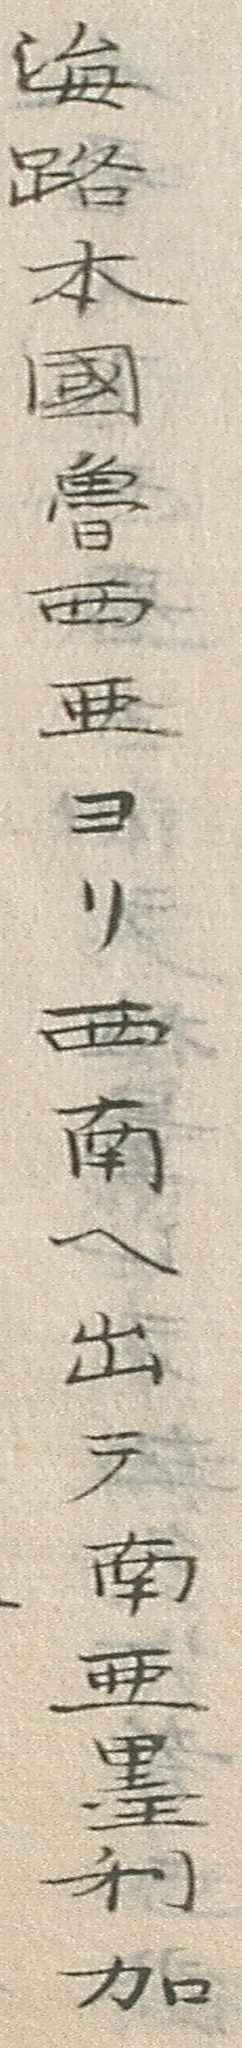海路本国魯西亜ヨリ西南ヘ出テ南亜墨利加
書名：天學略名目羽翼　全
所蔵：東京大学地震研究所図書室 Earthquake Research Institute Library, The University of Tokyo, JAPAN
